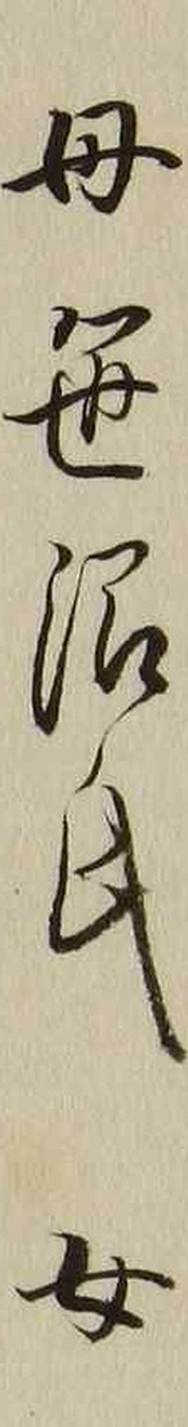母笹沼氏女
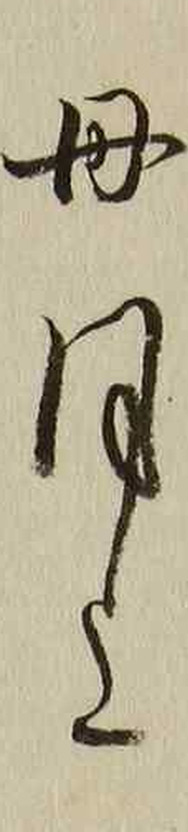母同上
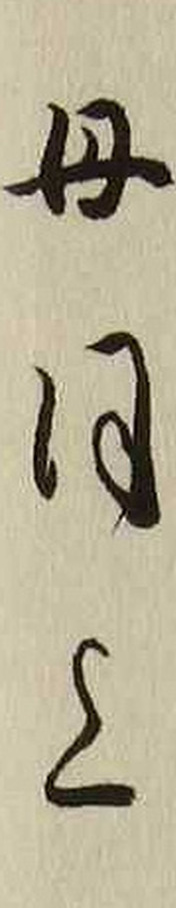母同上
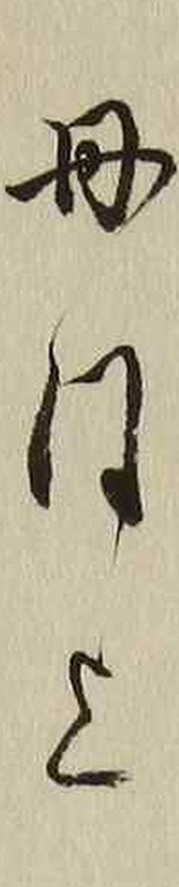母同上
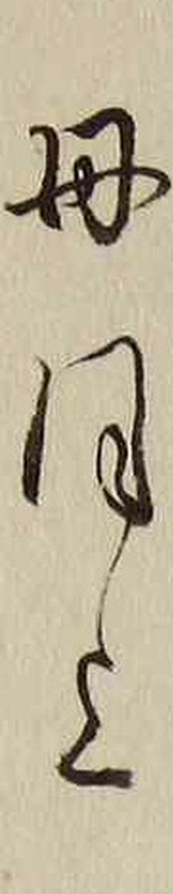母同上
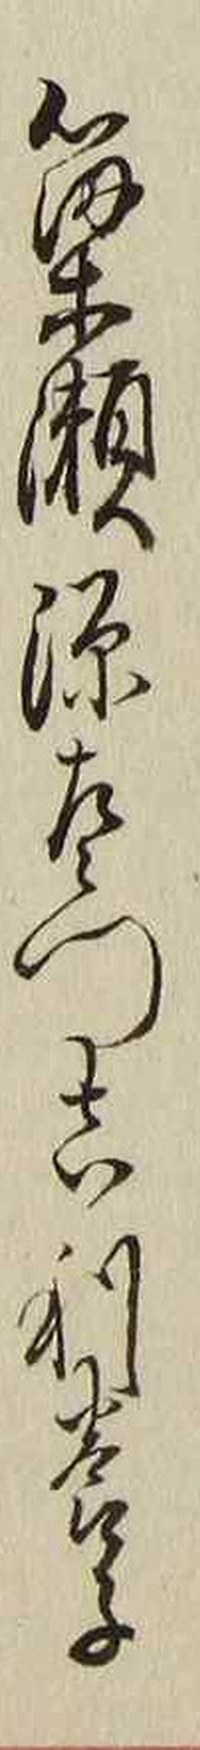簗瀬源左衛門真利養子
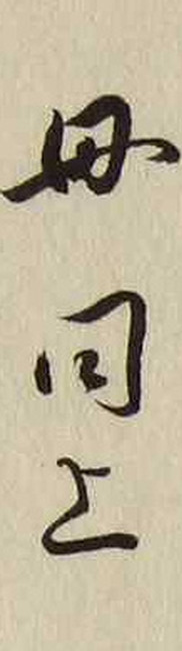母同上

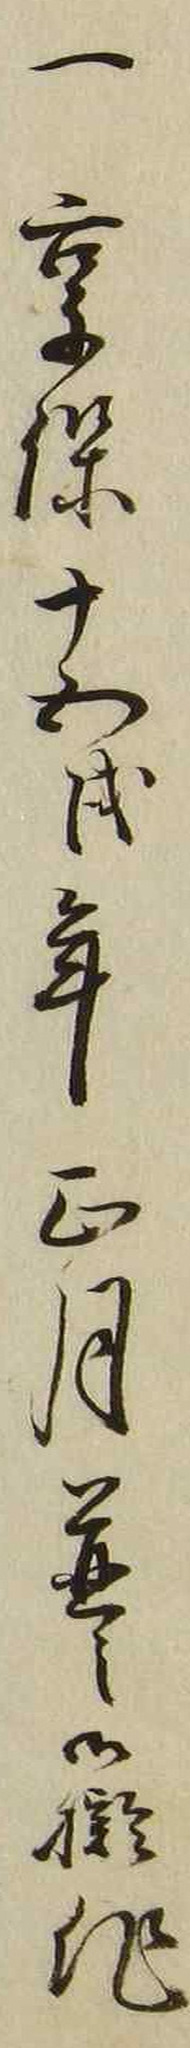一享保十五戊年正月並之御擬作
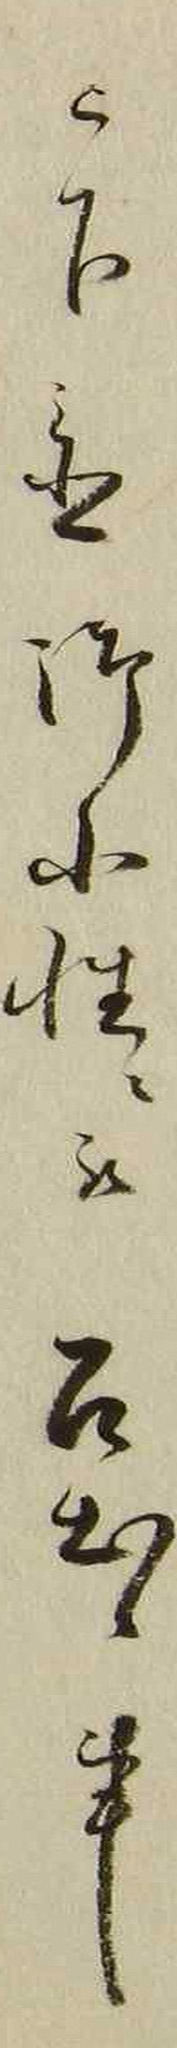被下置御小性ニ被召出候事
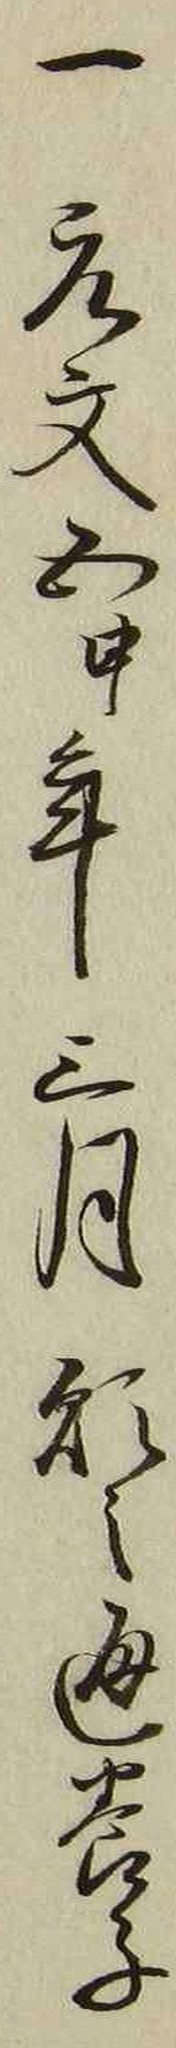一元文五申年三月願之通養子
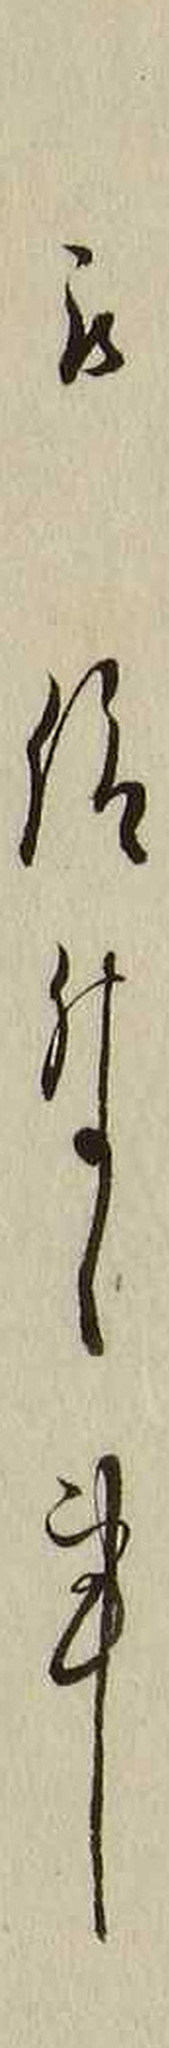被仰付候事
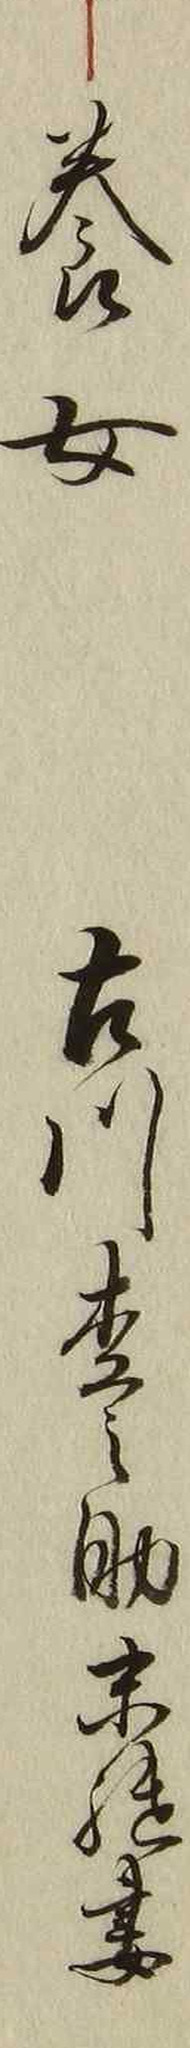養女古川杢之助末継妻
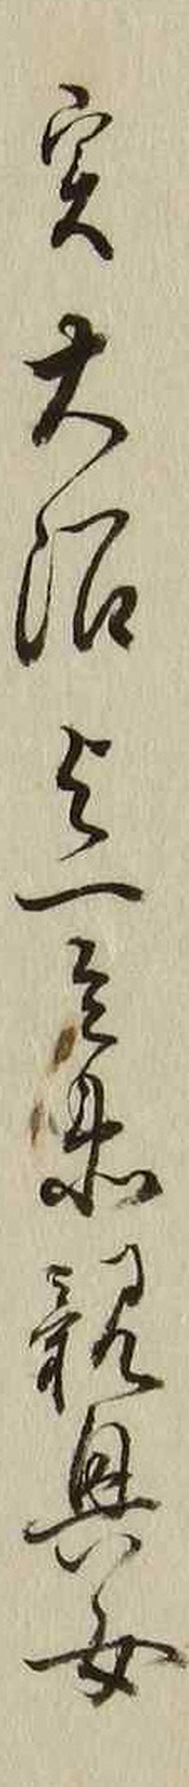実大沼与一兵衛親興女
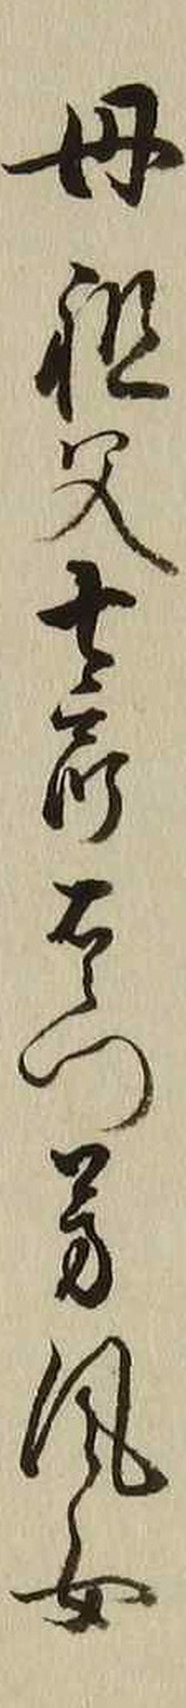母祖父七郎右衛門芳風女
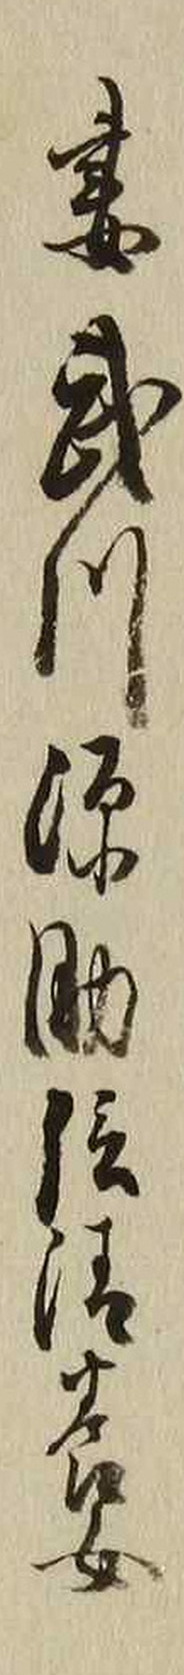妻武川源助信清養女
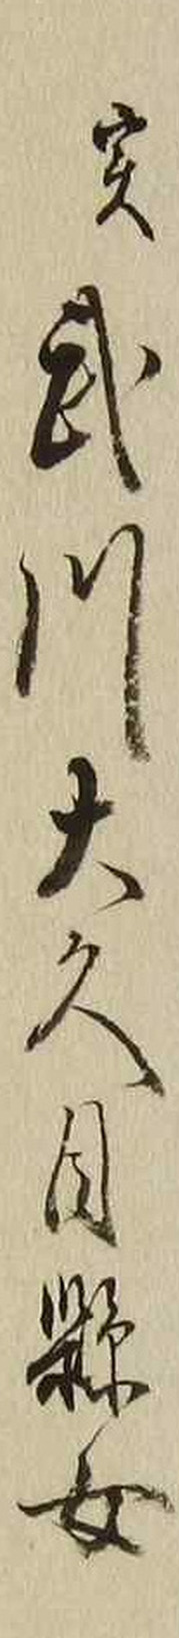実武川大久目縣女
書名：諸士系譜　巻之1　い之部1
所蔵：会津若松市立会津図書館
